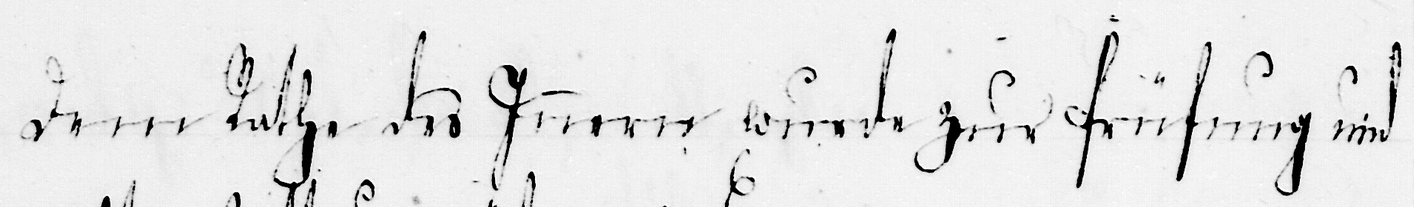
Dem Rathe des Innern wurde zur Prüfung und
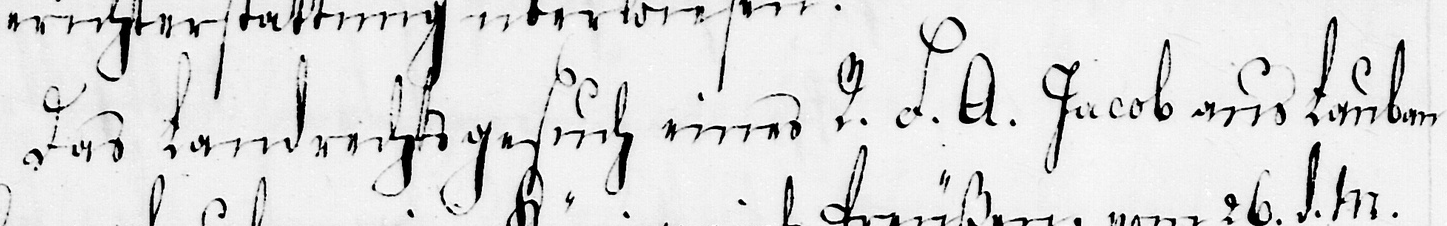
Das Landrechtsgesuch eines R. F. A. Jacob aus Laub¬
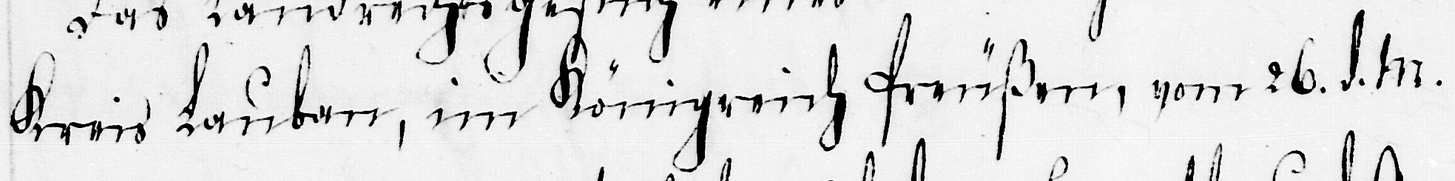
Kreis Lauban, im Königreich Preußen, vom 26. d. M.
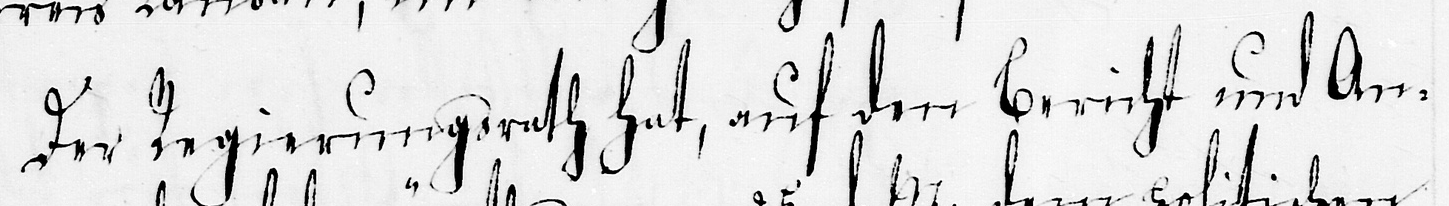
Der Regierungsrath hat, auf den Bericht und An¬
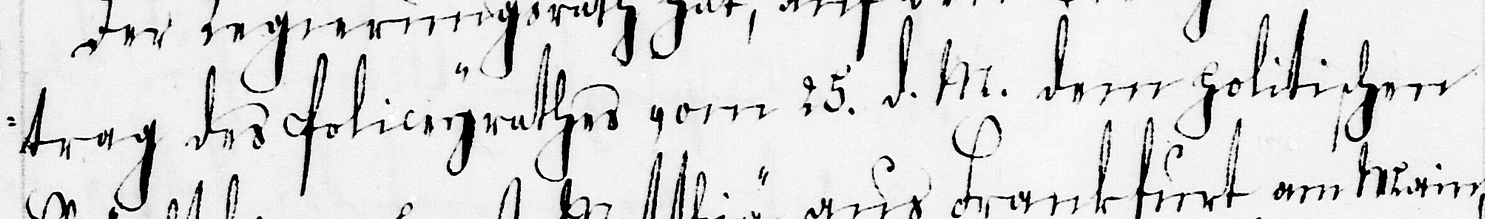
trag des Policeyrathes vom 25. d. M. dem politischen
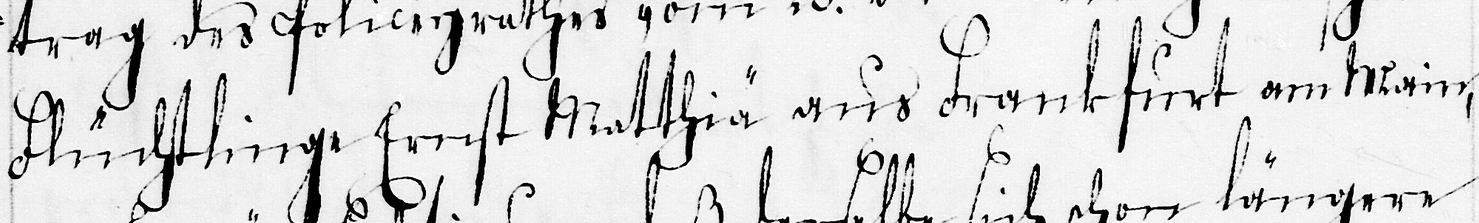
Flüchtlinge Ernst Matthiä aus Frankfurt am Main,
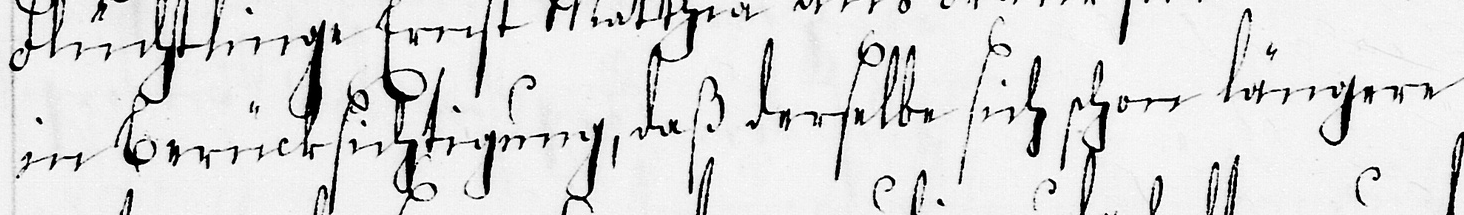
in Berücksichtigung, daß derselbe sich schon längere
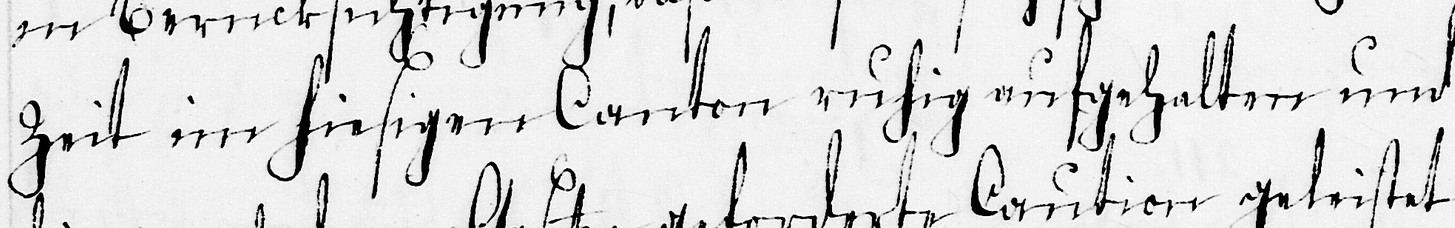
Zeit im hiesigen Canton ruhig aufgehalten und
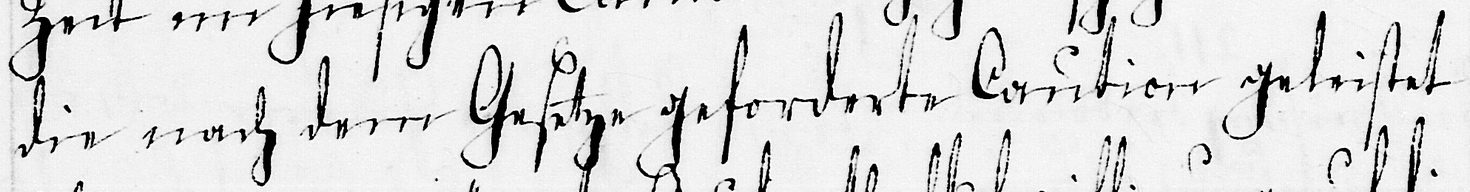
die nach dem Gesetze geforderte Caution geleistet
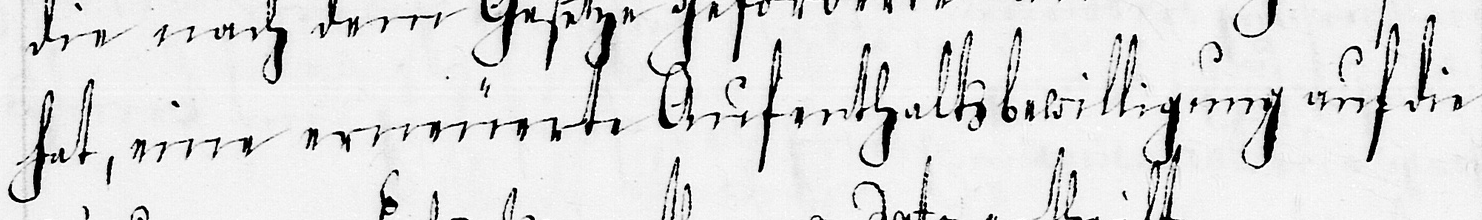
hat, eine erneuerte Aufenthaltsbewilligung auf die
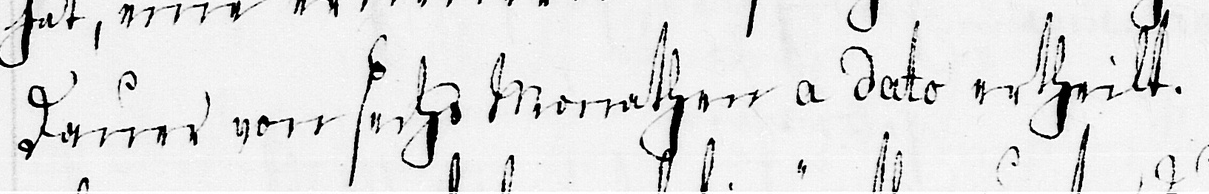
Dauer von sechs Monathen a dato ertheilt.
